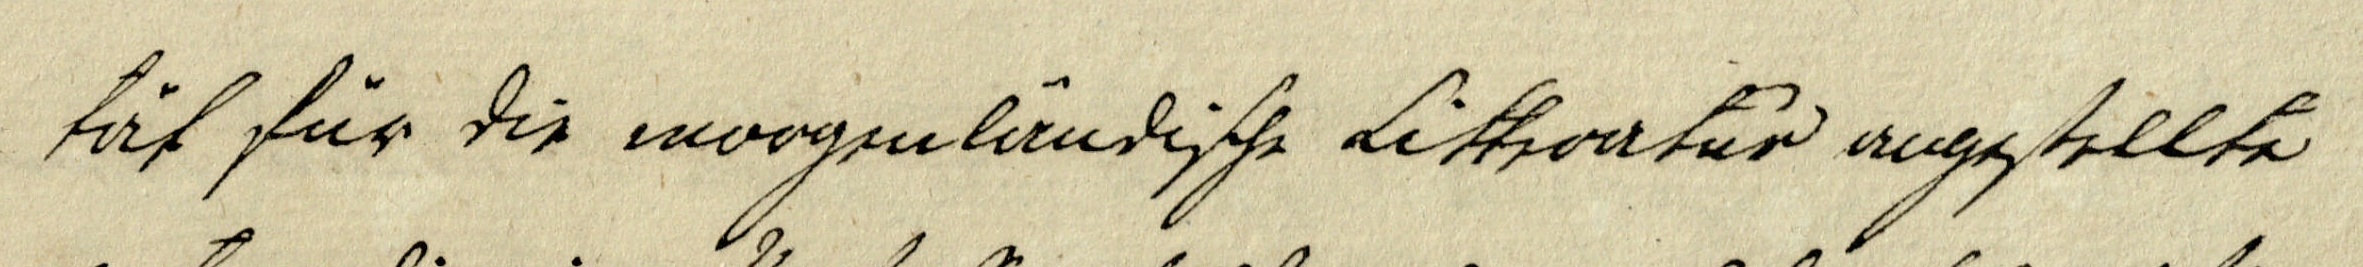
tät für die morgenländischen Litteratur angestellte
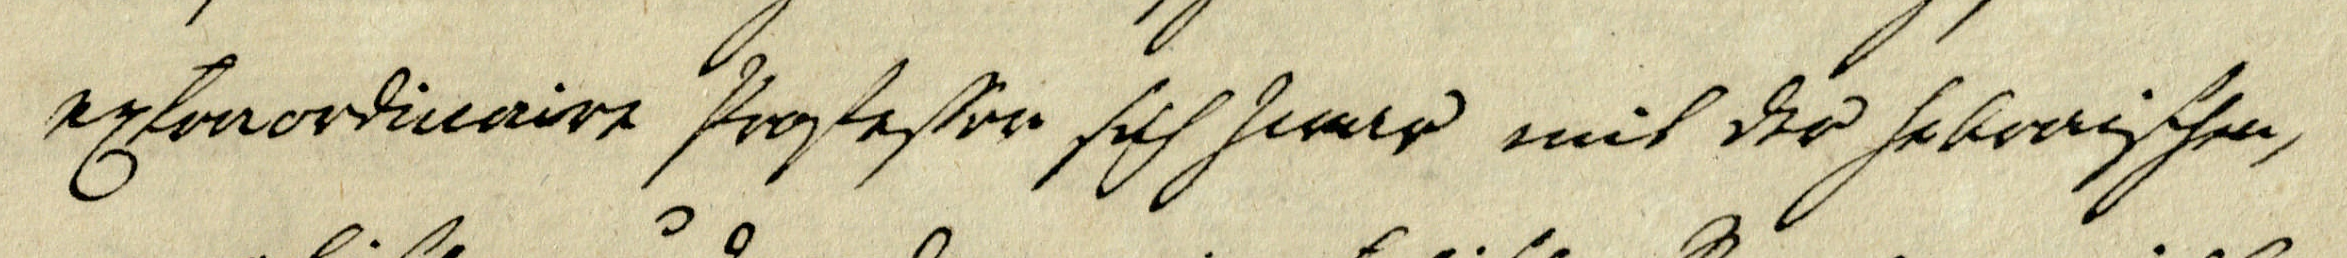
extraordinaire Professor sich zwar mit der hebraischen,
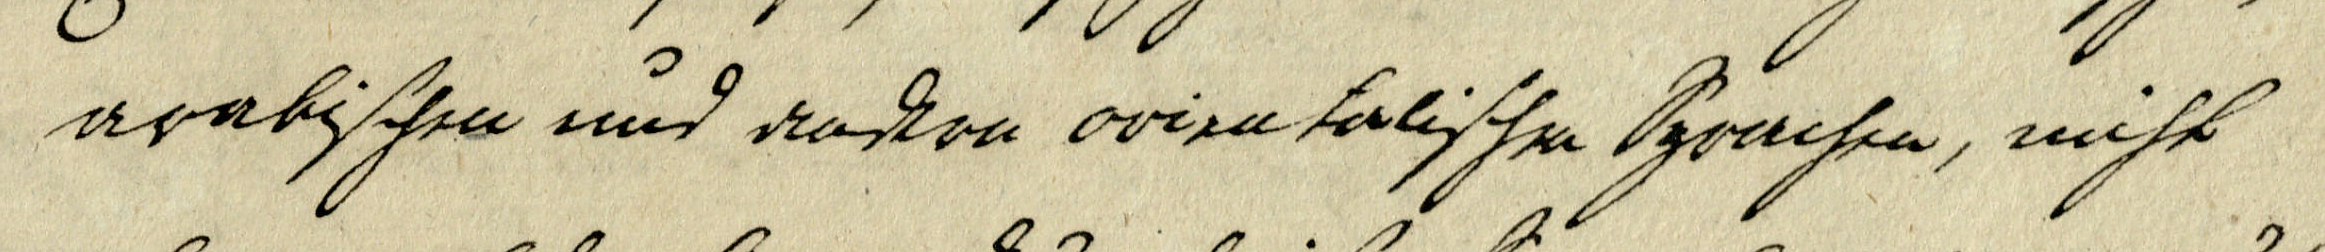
arabischen und andern orientalischen Sprachen, nicht
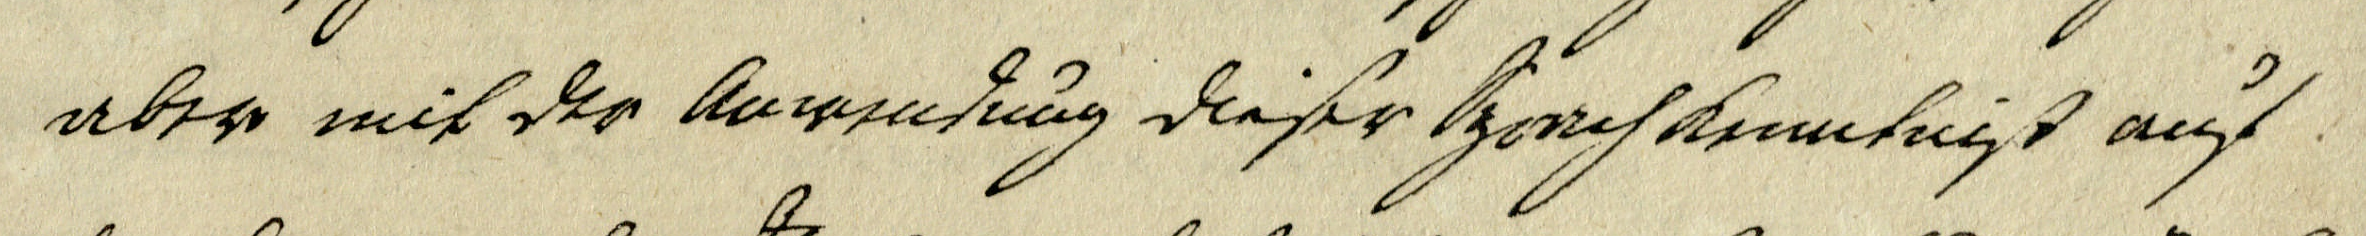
aber mit der Anwendung dieser Sprachkenntniß auf
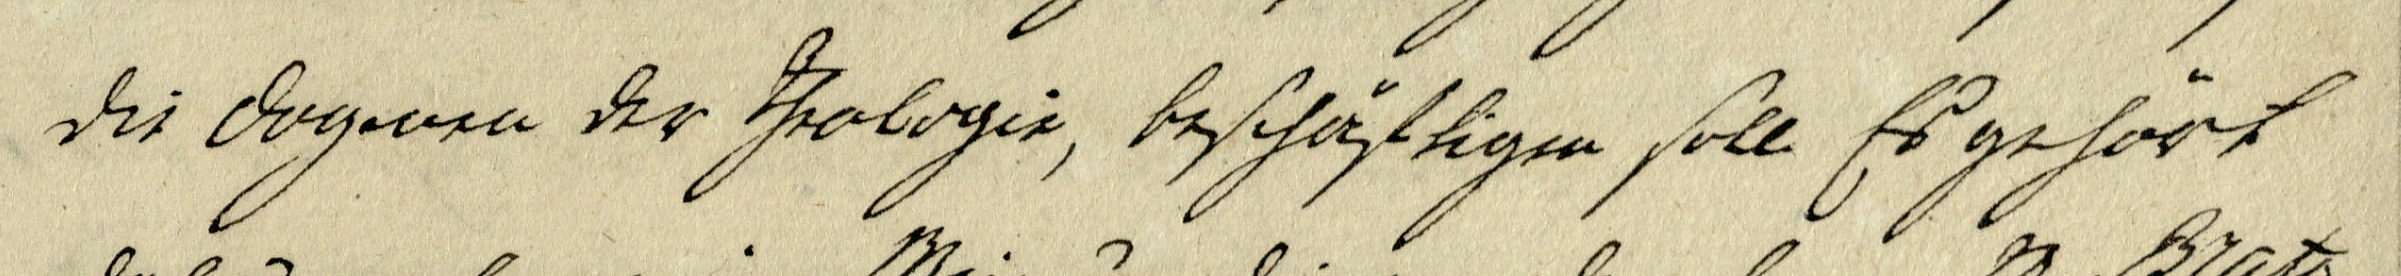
die Dogmen der Theologie, beschäftigen soll. Es gehört
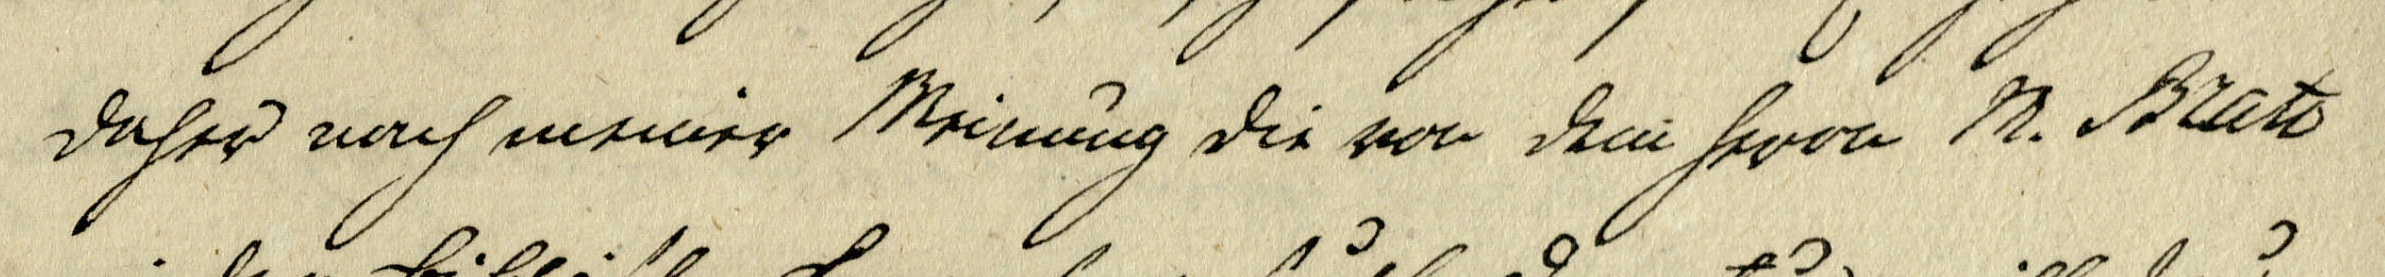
daher nach meiner Meinung die von dem Herrn M. Bratt
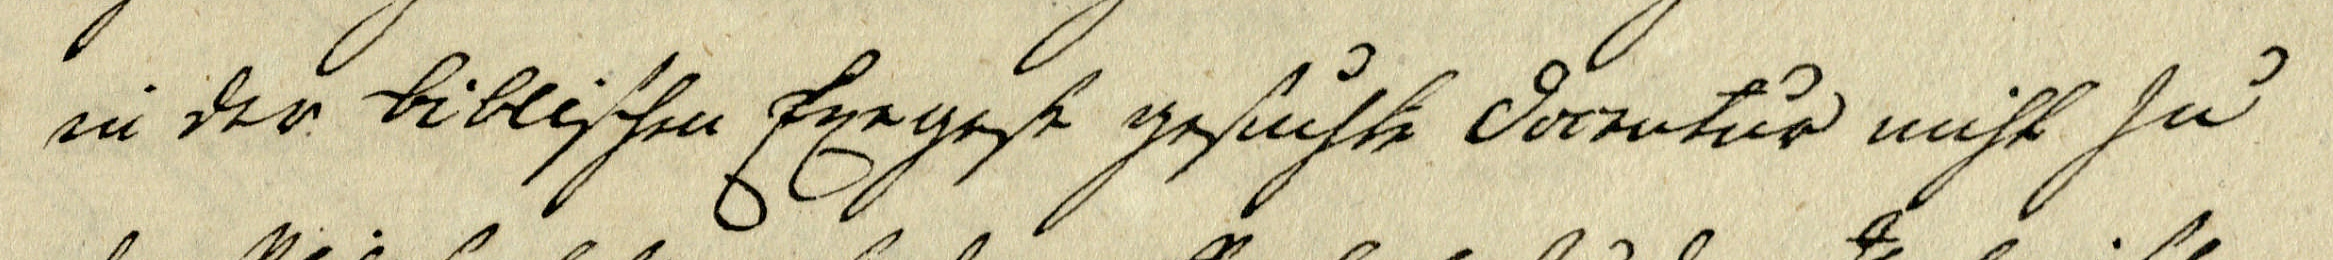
in der biblischen Exegese gesuchte Docentur nicht zu
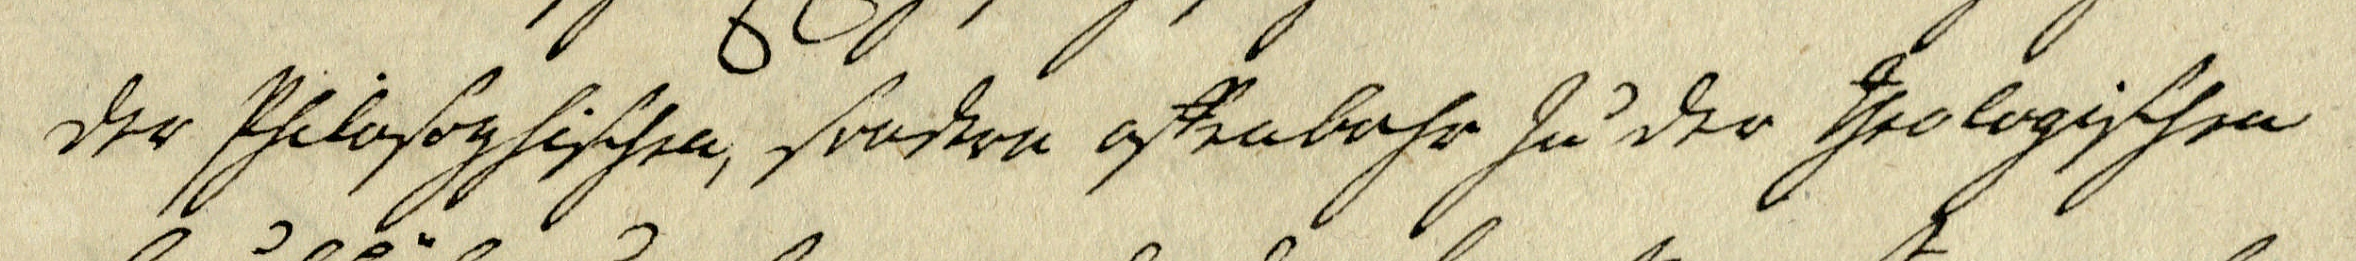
der Philosophischen, sondern offenbahr zu der Theologischen
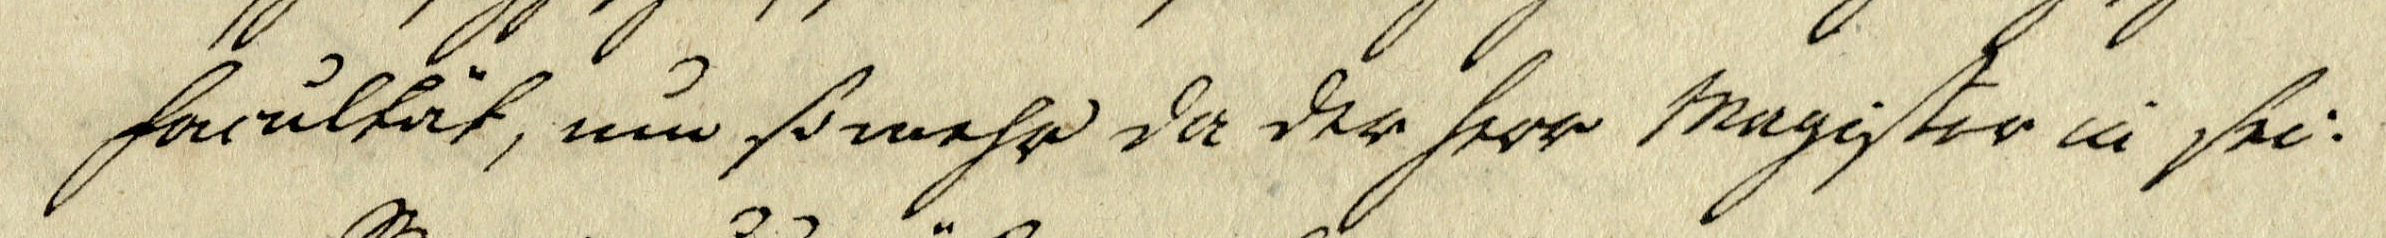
Facultät, um so mehr da der Herr Magister in sei¬
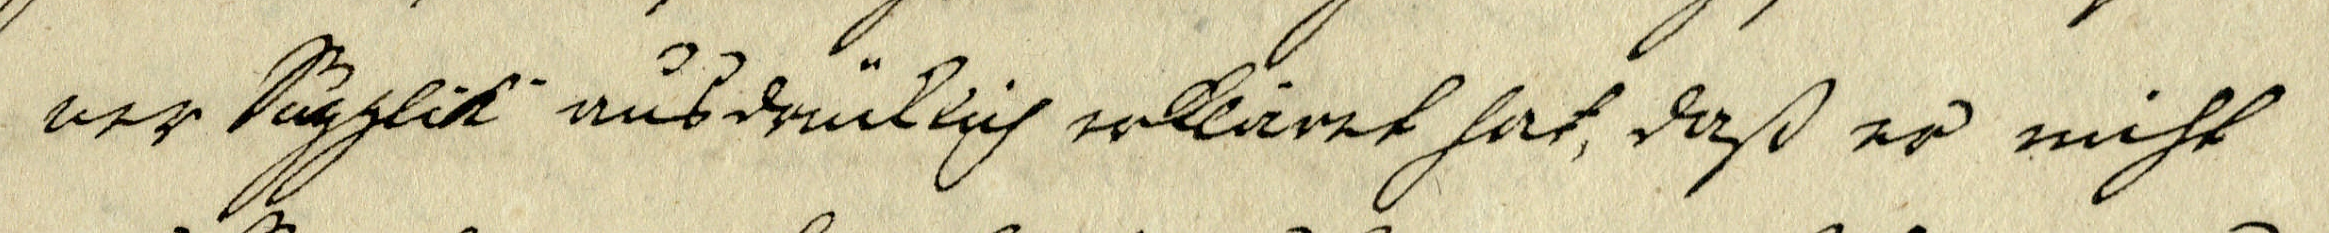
ner Supplik ausdrücklich erkläret hat, daß er nicht
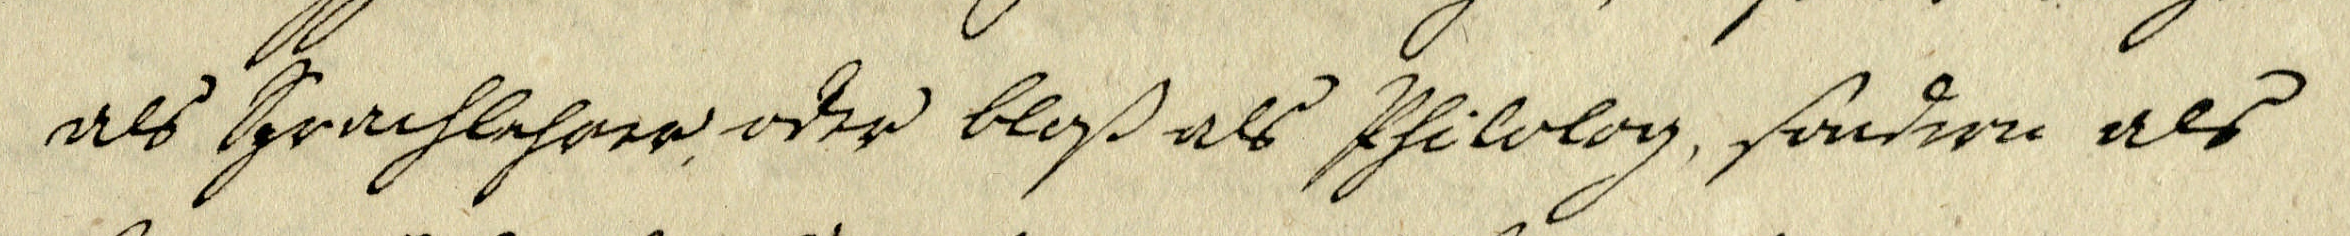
als Sprachlehrer oder bloß als Philolog, sondern als
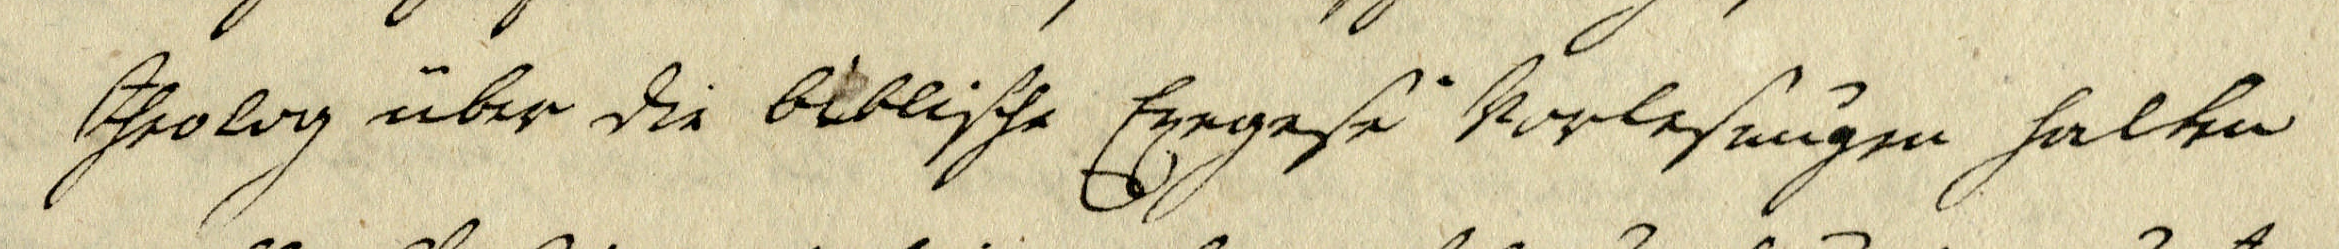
Theolog über die biblische Exegese Vorlesungen halten
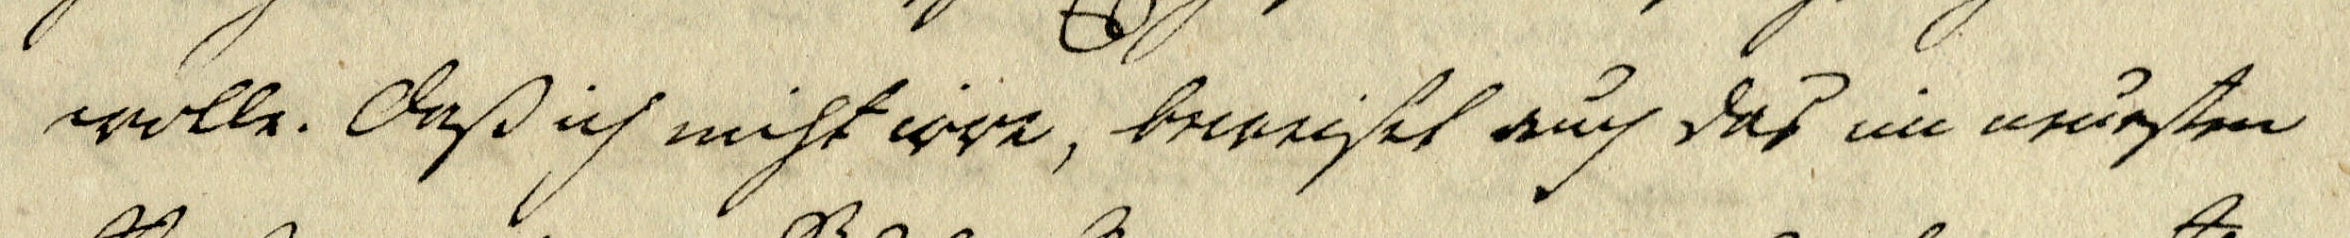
wolle. Daß ich nicht irre, beweiset auch das im neuesten
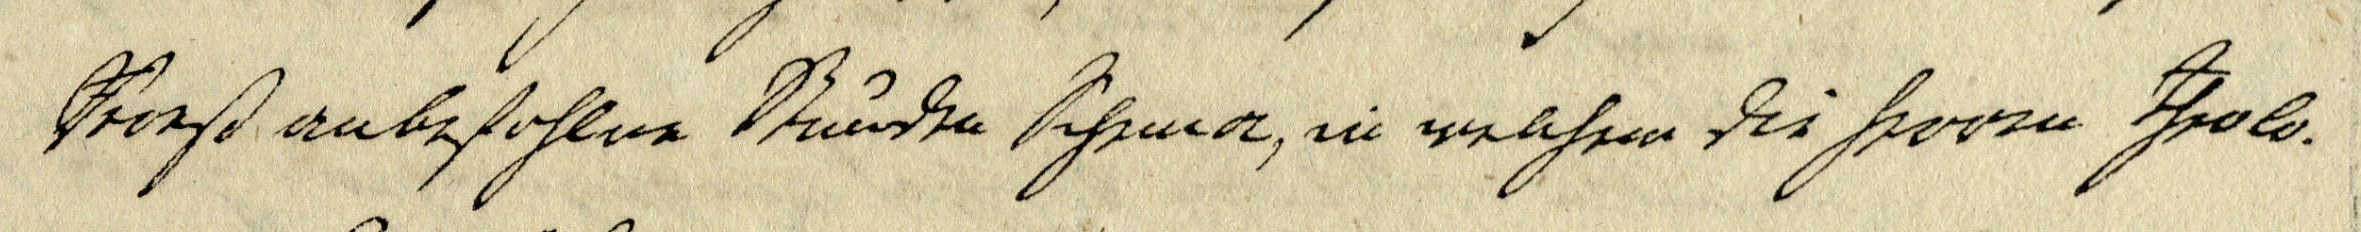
Receß anbefohlne Stunden Schema, in welchem die Herren Theolo¬
